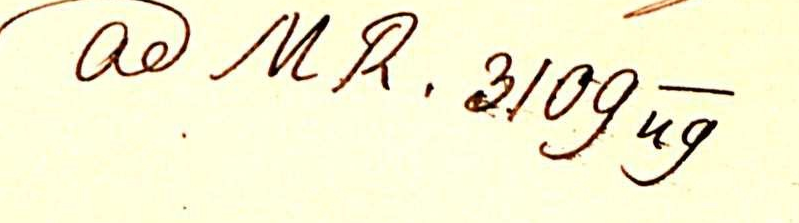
ad MR 3109/49
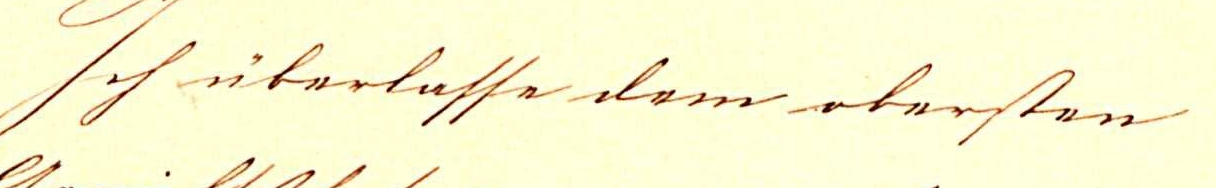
Ich überlasse dem obersten
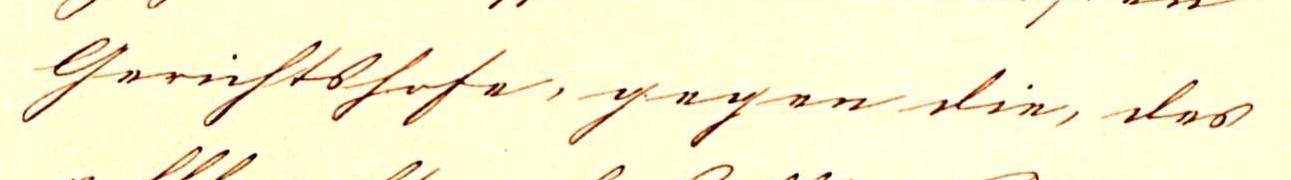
Gerichtshofe, gegen die, des
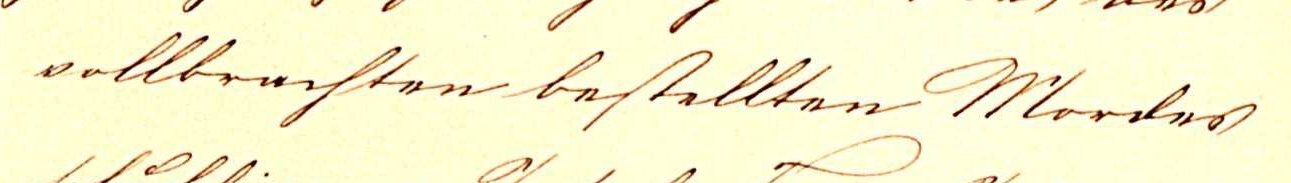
vollbrachten bestellten Mordes
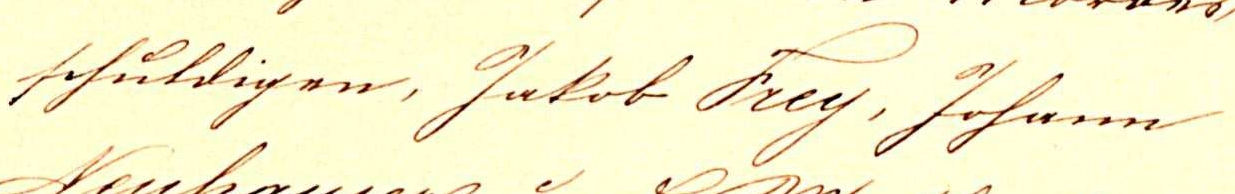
schuldigen, Jakob Frey, Johann
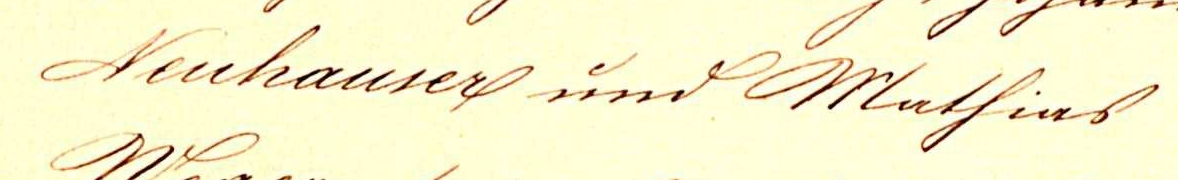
Neuhauser und Mathias
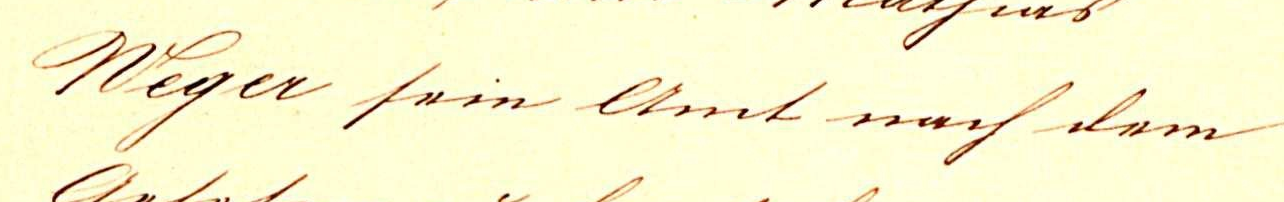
Weger sein Amt nach dem
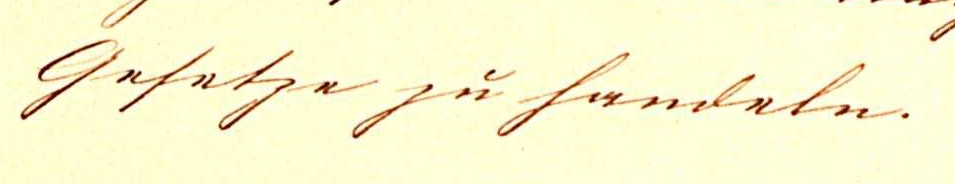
Gesetze zu handeln.
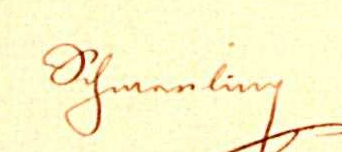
Schmerling
